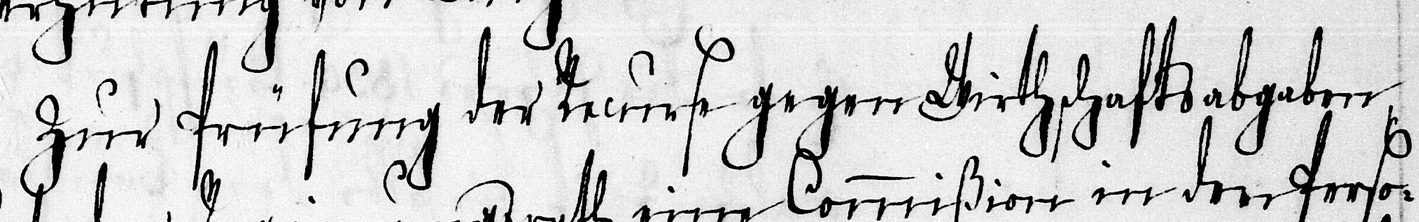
Zur Prüfung der Recurse gegen Wirthschaftsabgaben
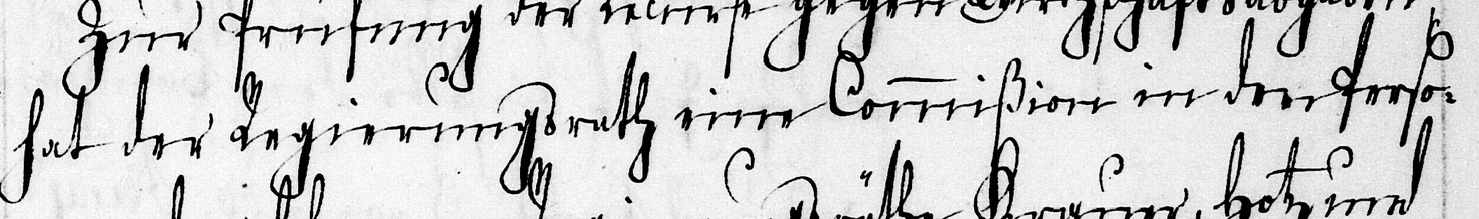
hat der Regierungsrath eine Commißion in den Perso¬
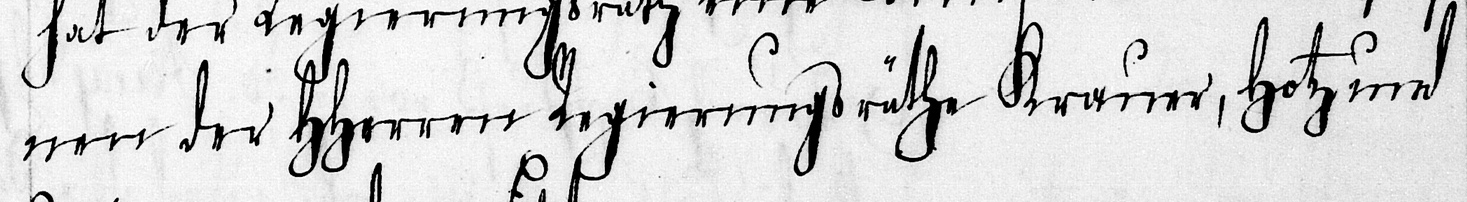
nen der HHerren Regierungsräthe Krauer, Hotz und
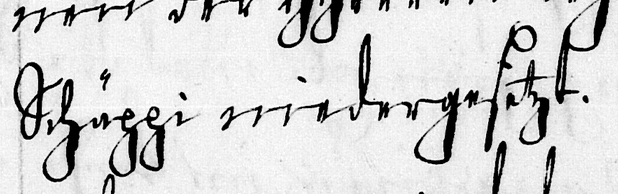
Schäppi niedergesetzt.
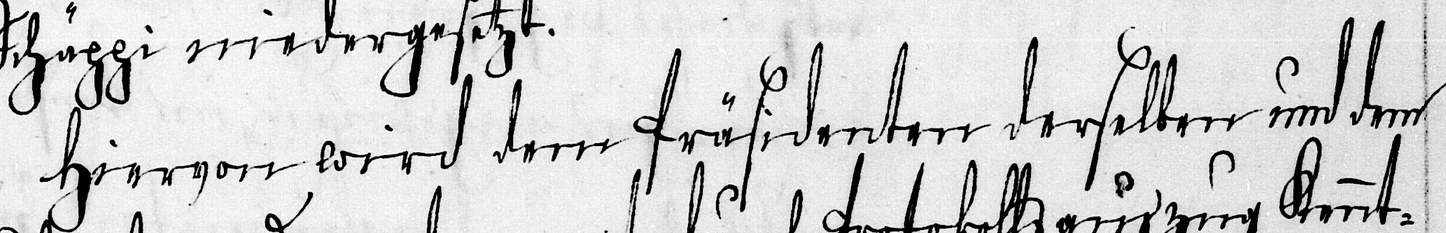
Hiervon wird dem Präsidenten derselben und dem
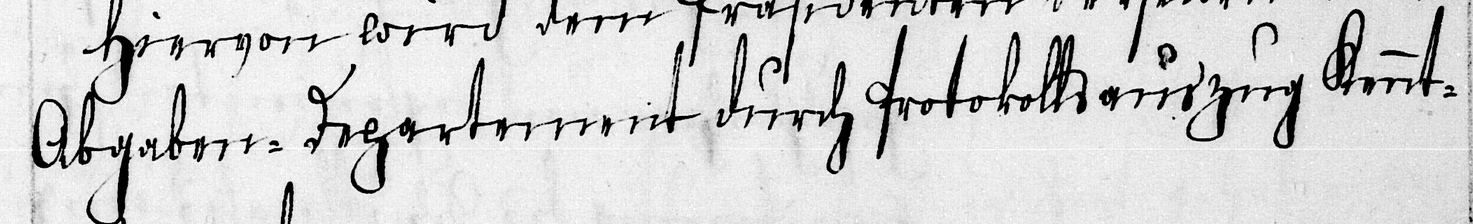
Abgaben-Departement durch Protokollsauszug Kennt¬
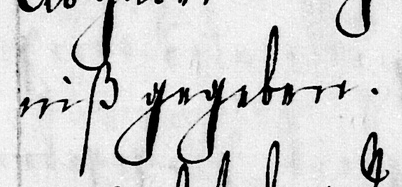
niß gegeben.
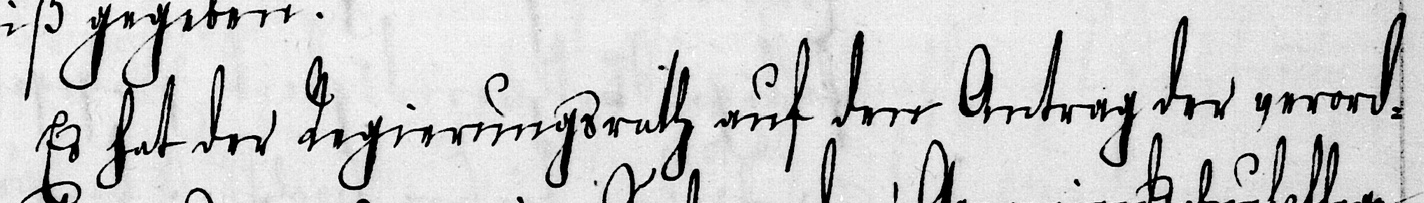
Es hat der Regierungsrath auf den Antrag der verord¬
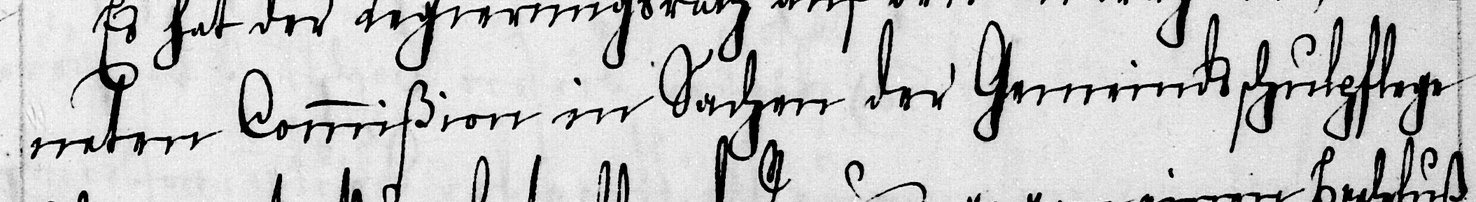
neten Commißion in Sachen der Gemeindsschulpflege
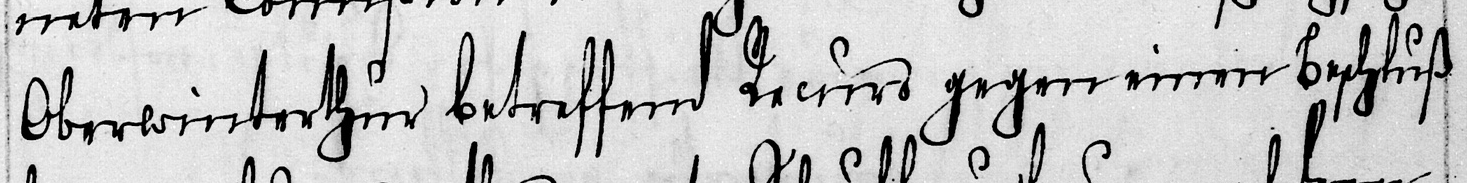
Oberwinterthur betreffend Recurs gegen einen Beschluß
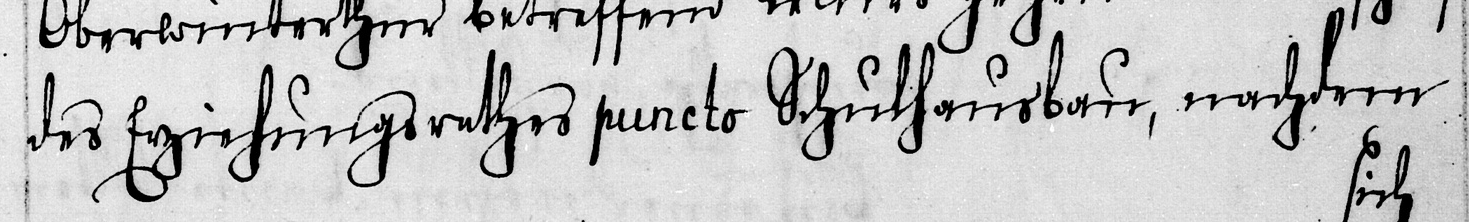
des Erziehungsrathes puncto Schulhausbau, nachdem
